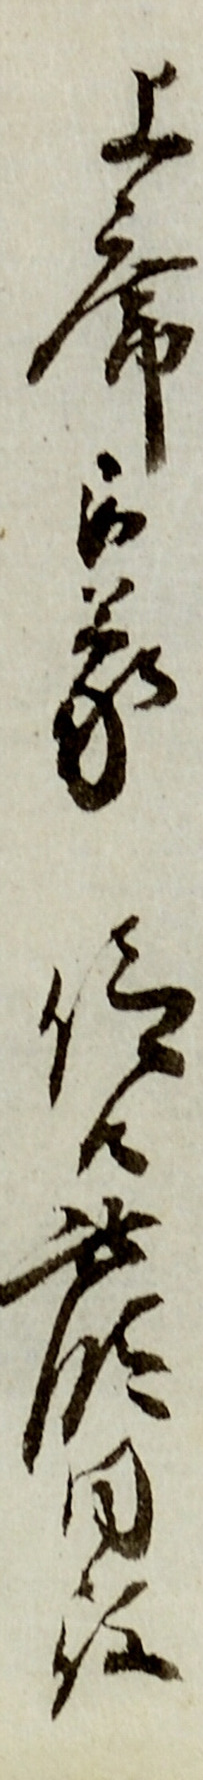上席被蒙仰候此段同役
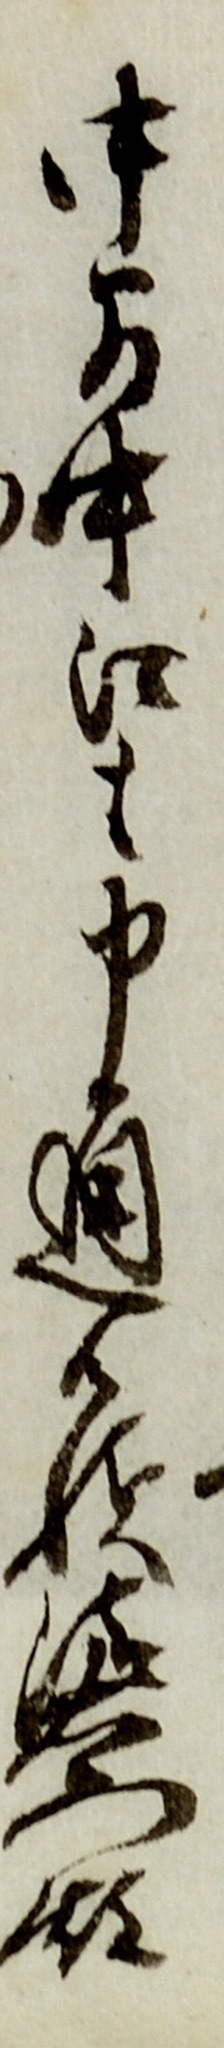中間中えも申通候様清右衛門殿
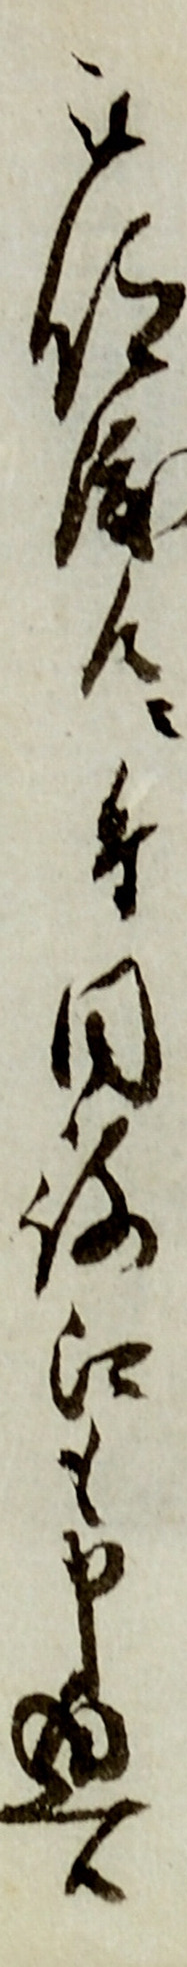被仰渡候に付同役えも申通候
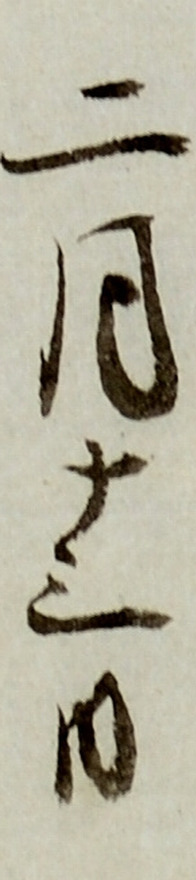二月十三日
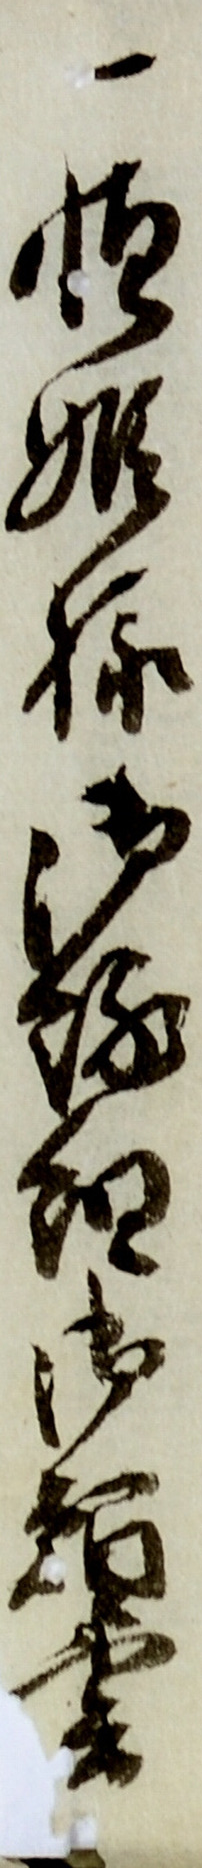一恒姫様御縁組御願書
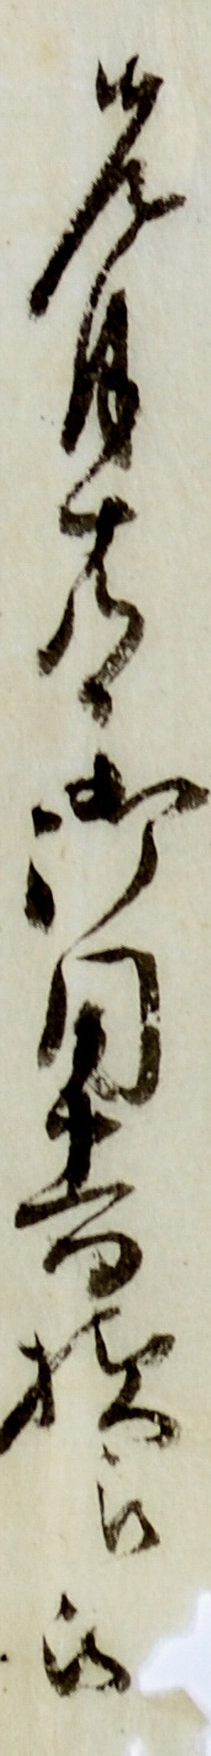先月十八日御用番様え被
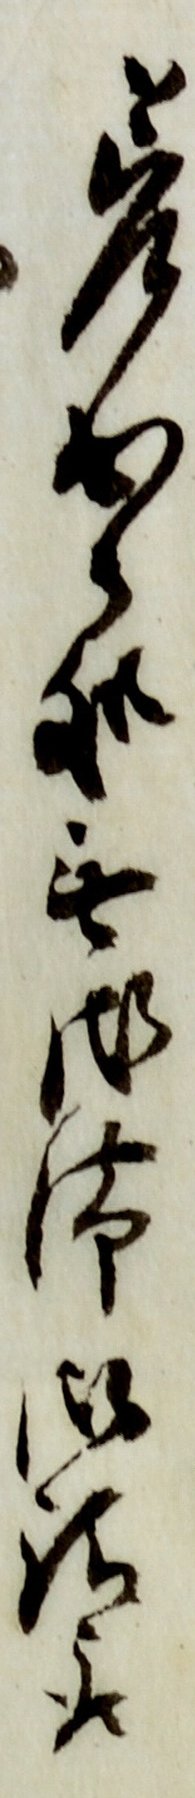差出候処無御滞御請取
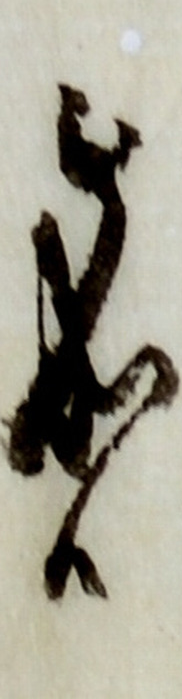被成候
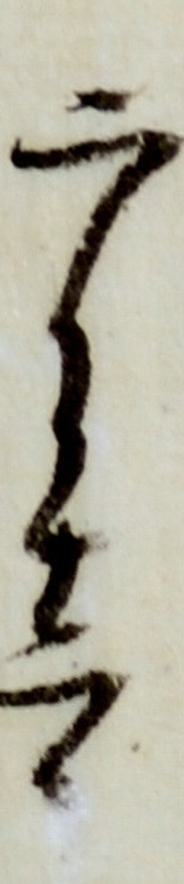二月十三日

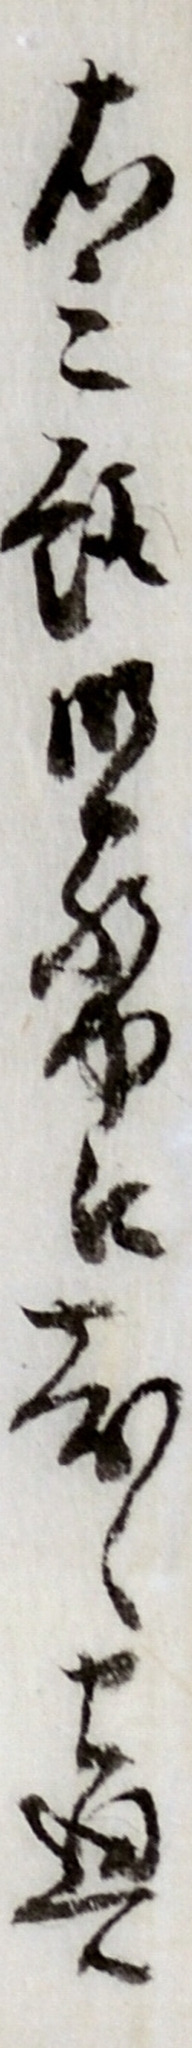右之趣御家中え寄々申通候
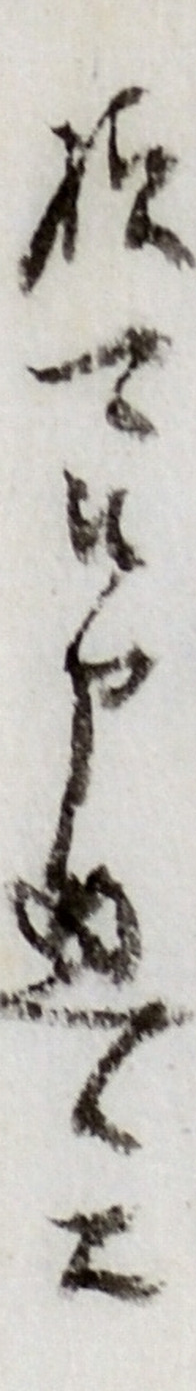様可被申通候以上
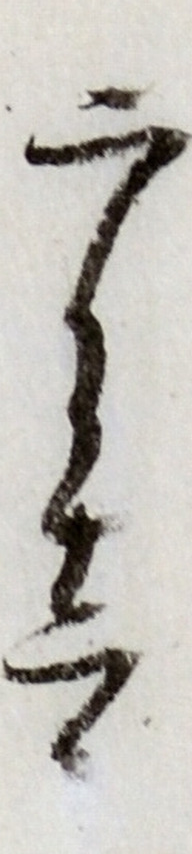二月十二日
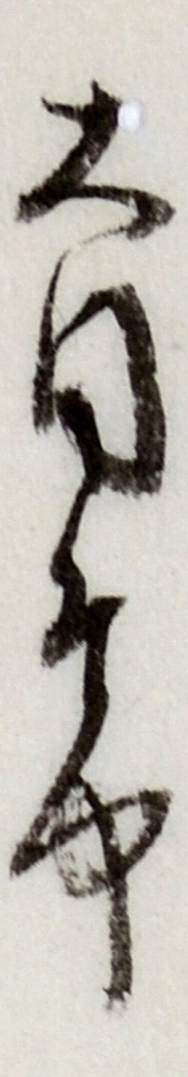大目付中
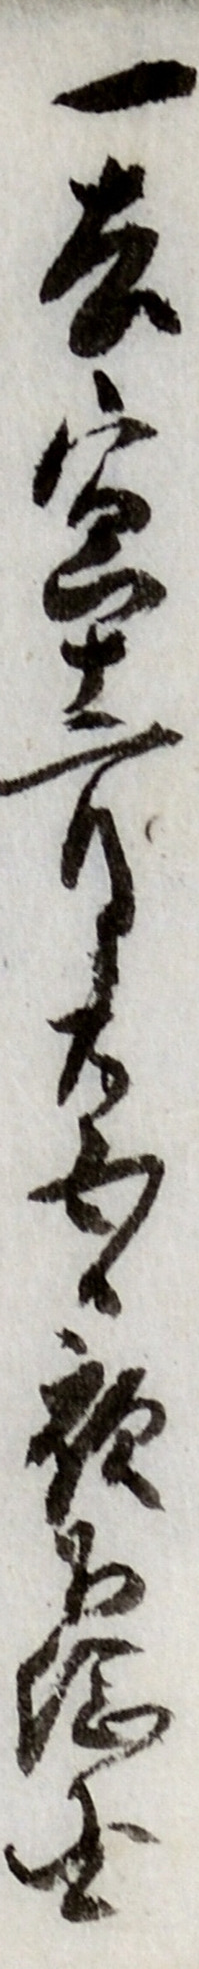一去寅十二月廿五日夜下総国
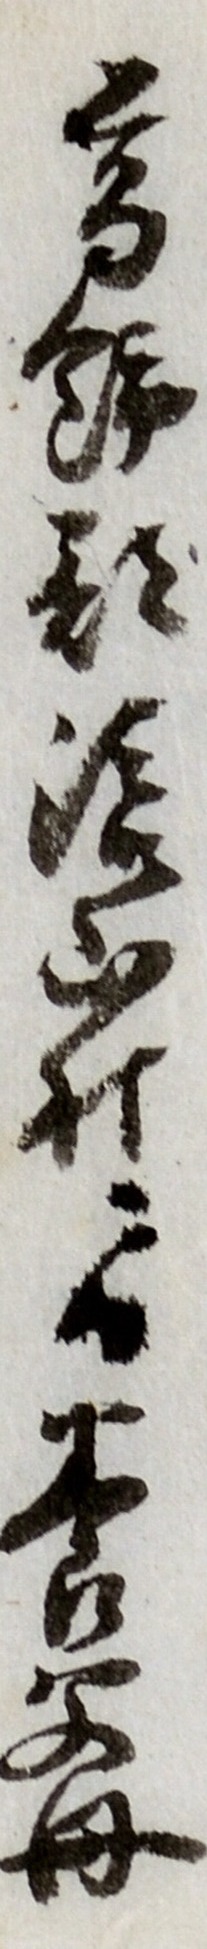葛飾郡流山村にて養父母
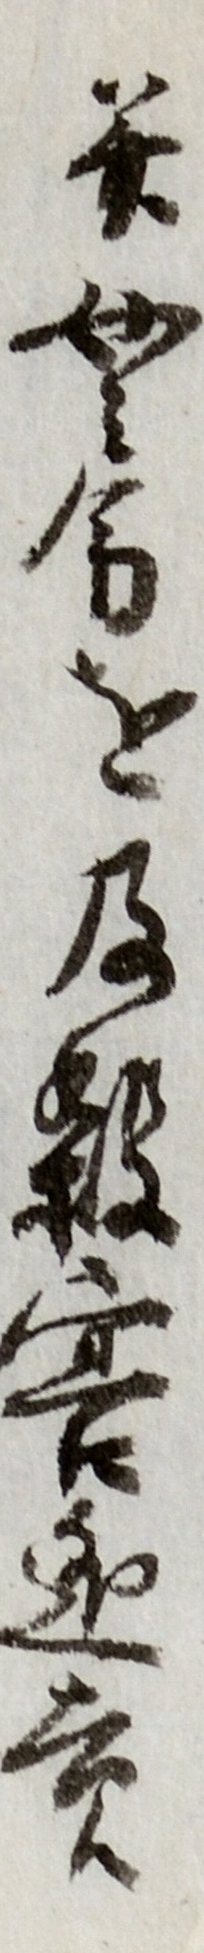并女房を及殺害逃去候
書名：諸事御用留帳
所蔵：伊那市立高遠町図書館・合同会社AMANE
